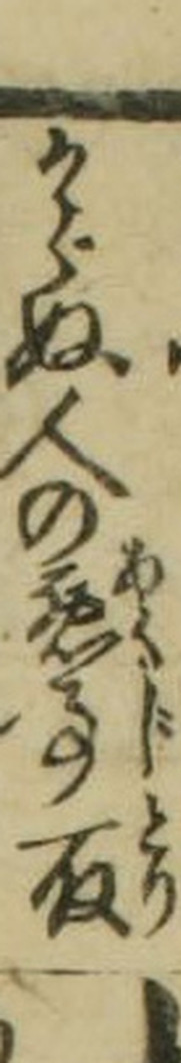からぬ人の悪事取
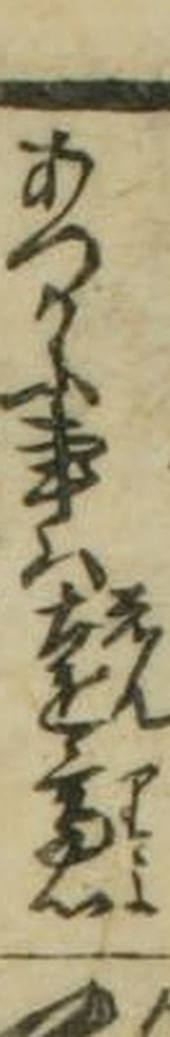あつかふ事は遠慮
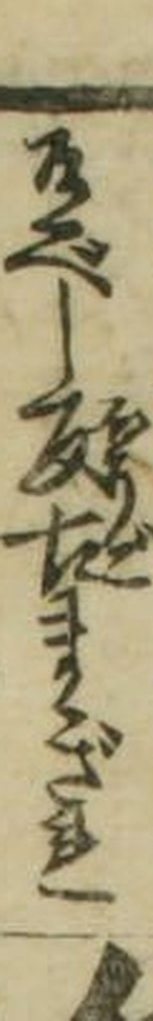有べし反古まぎれ
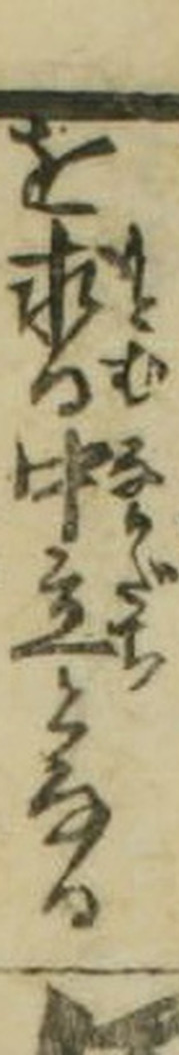を求る中立となる
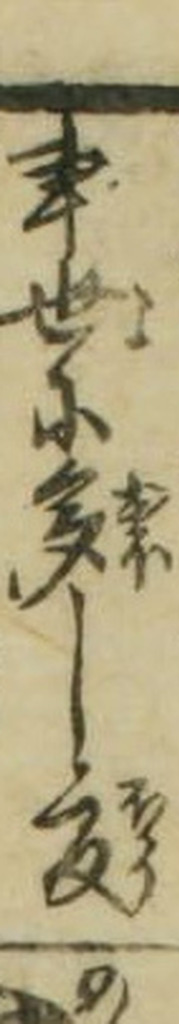事世に多し反
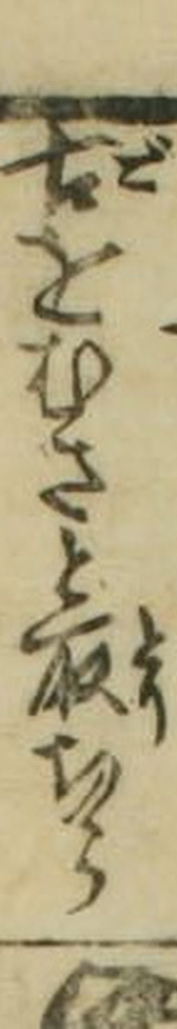古をむさと取切ら
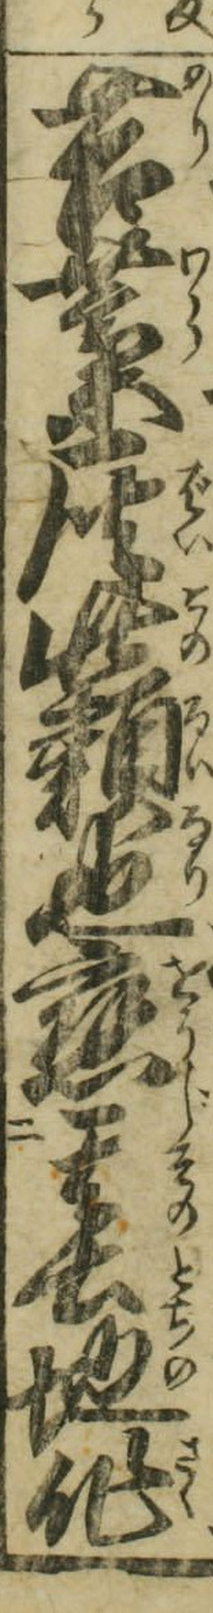苔藁灰此類也応其土地作
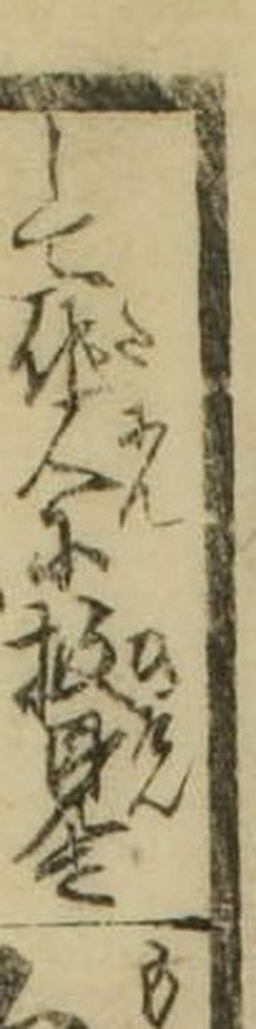して他人に披見せ
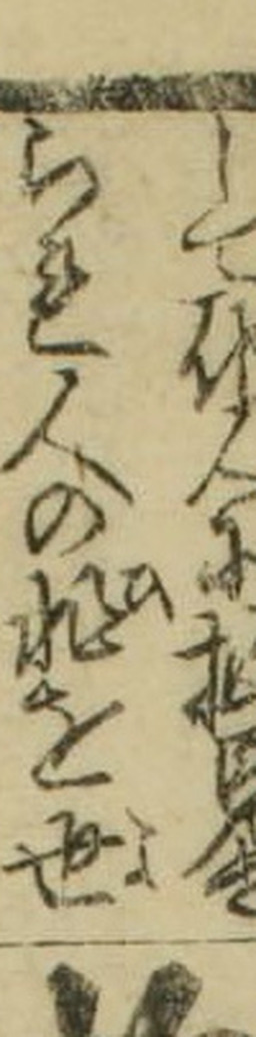られ人の非を世
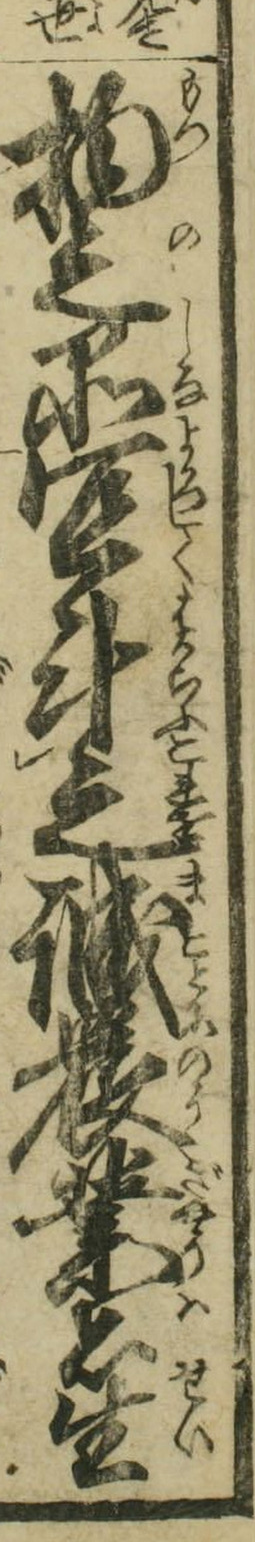物之品宜計之誠農業者生
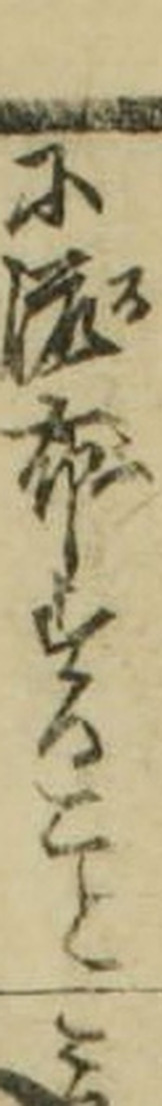に流布すること
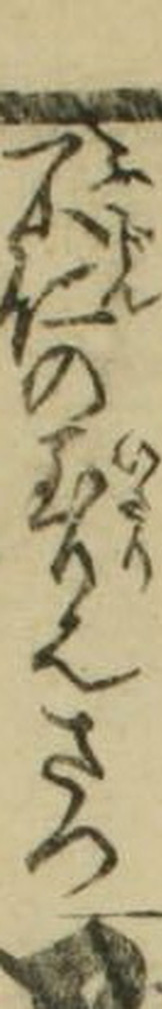不仁の至り也さつ
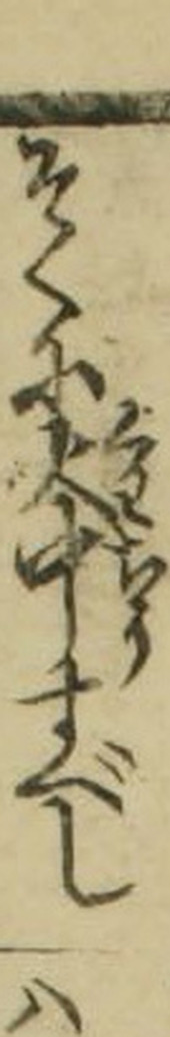そくに火中すべし
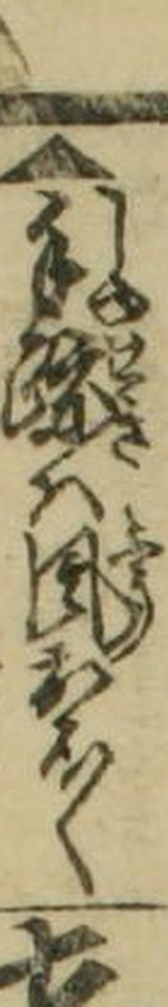▲手跡は風おほく
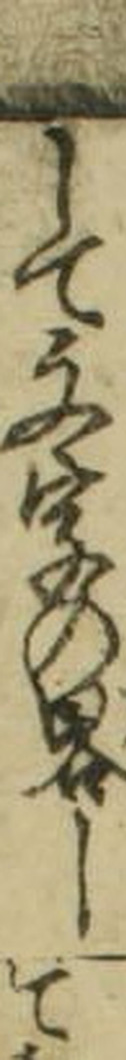して文字の畧し
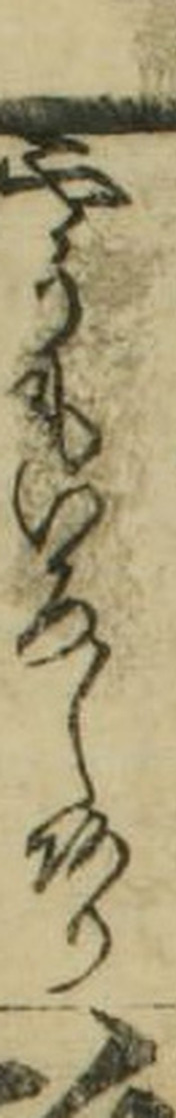やうもいろ〳〵あり
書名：増補職人往来
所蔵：東京学芸大学教育コンテンツアーカイブ
